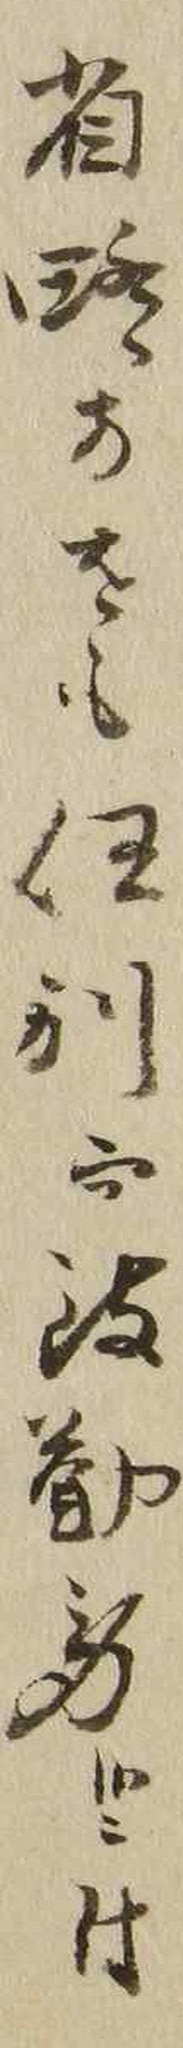省略方をも任別而致勤労候ニ付
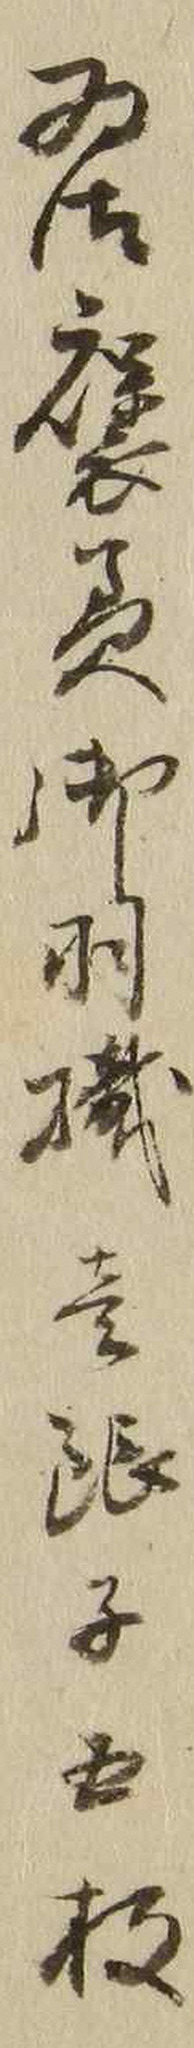為御褒美御羽織壱銀子五枚
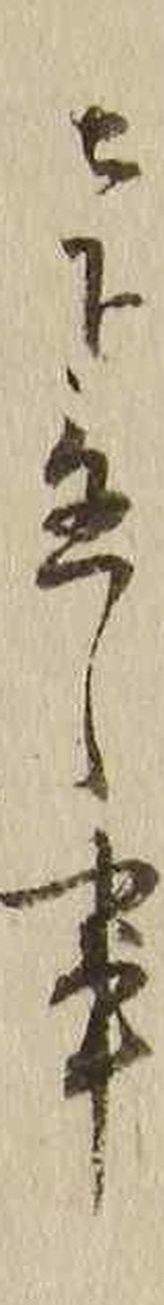被下置候事
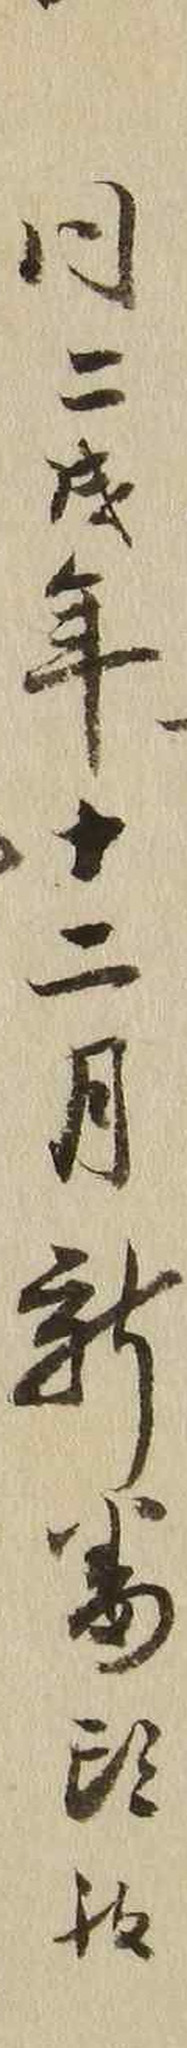一同二戌年十二月新番頭被
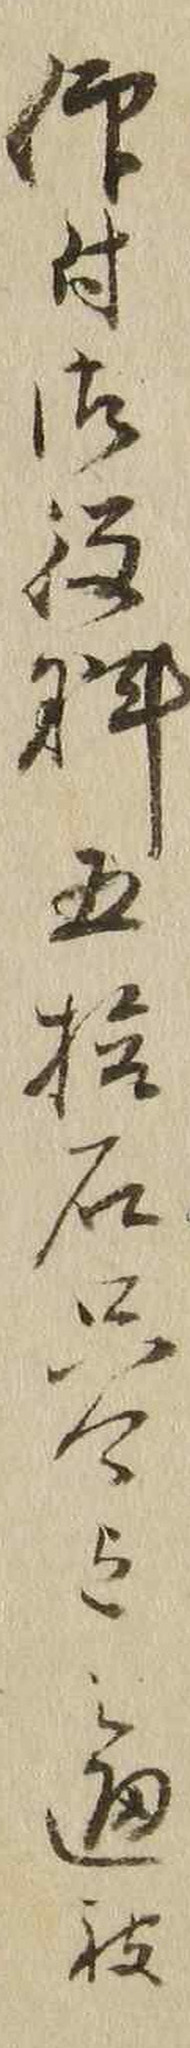仰付御役料五拾石只今迄之通被
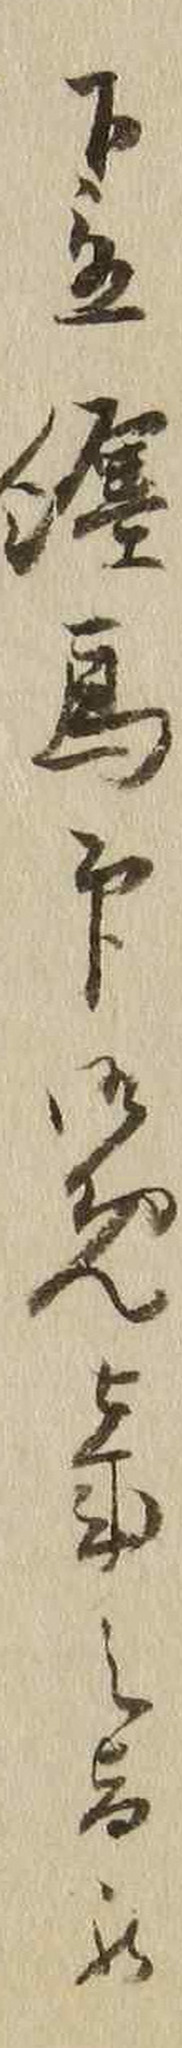下置纏馬印御免被成之旨被
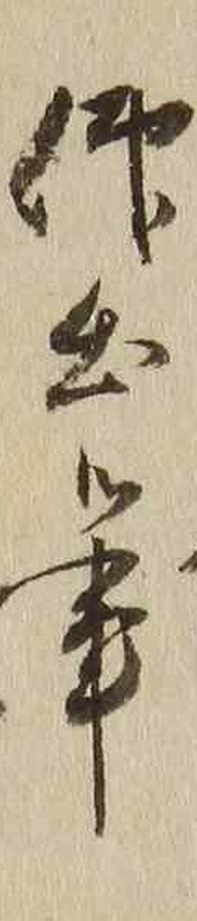仰出候事
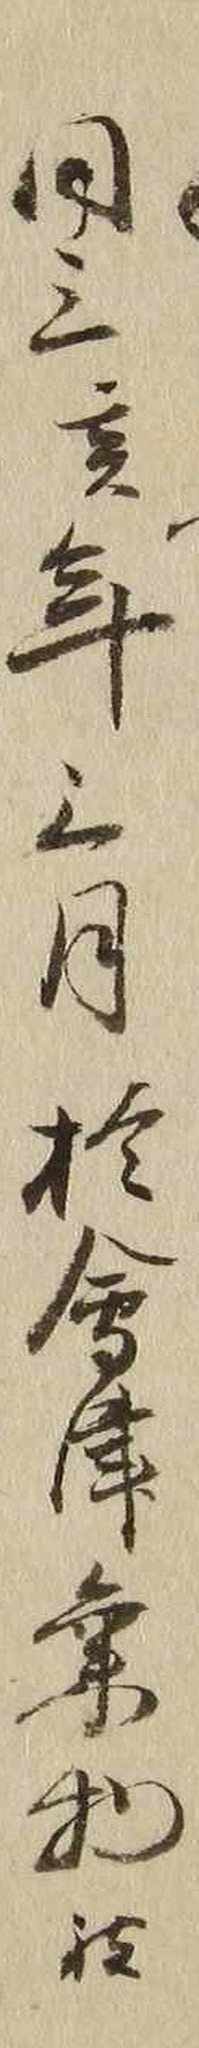一同三亥年三月於会津乗物被
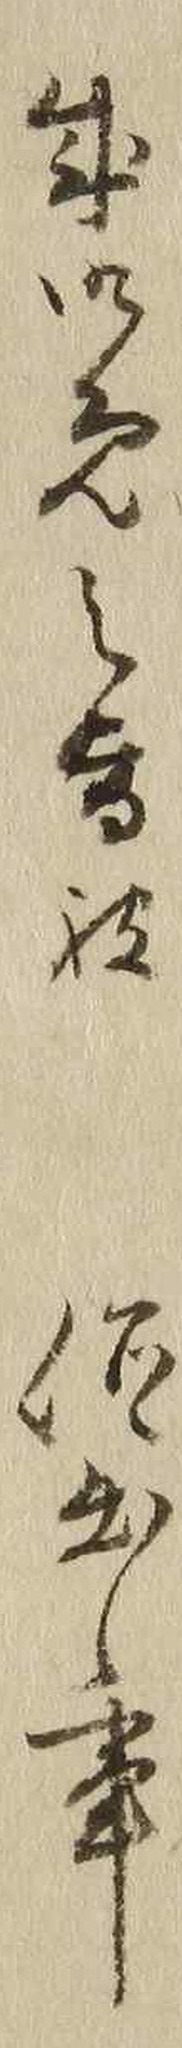成御免之旨被仰出候事
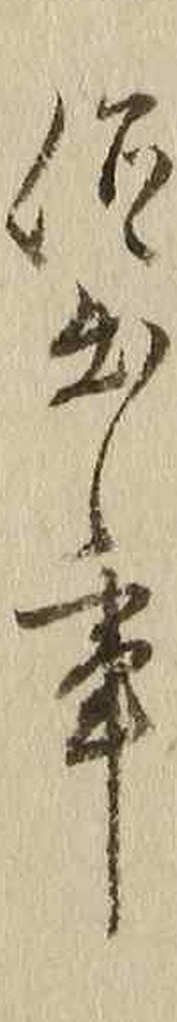仰出候事
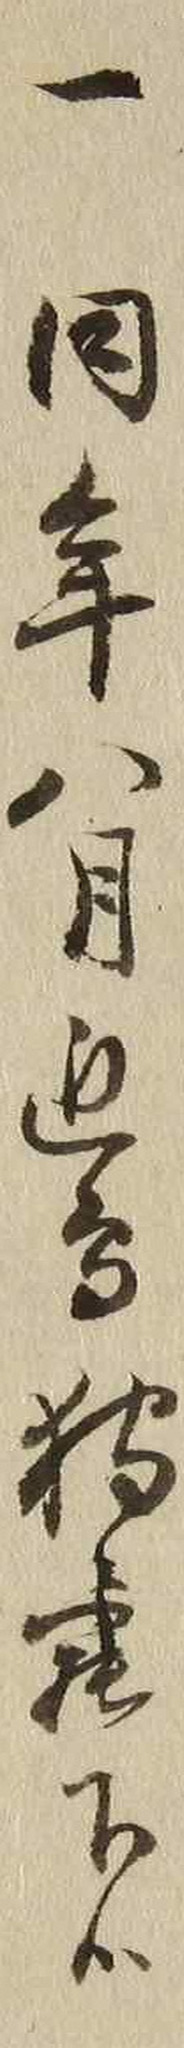一同年八月追鳥狩罷下候
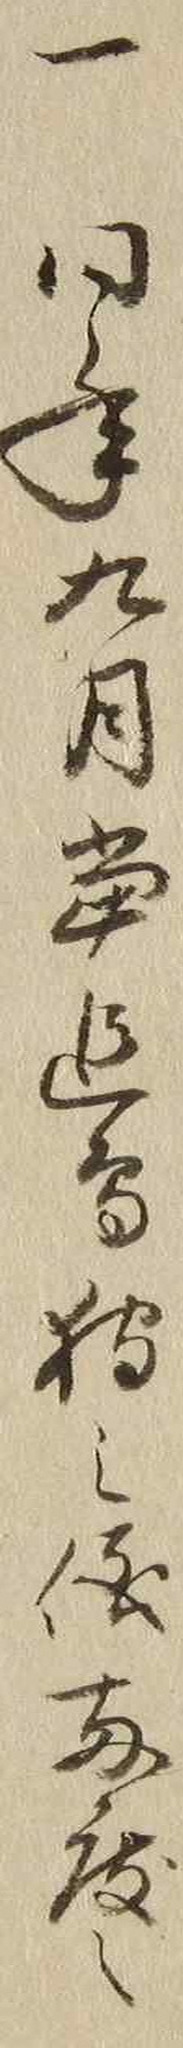一同年九月当追鳥狩之儀両度之
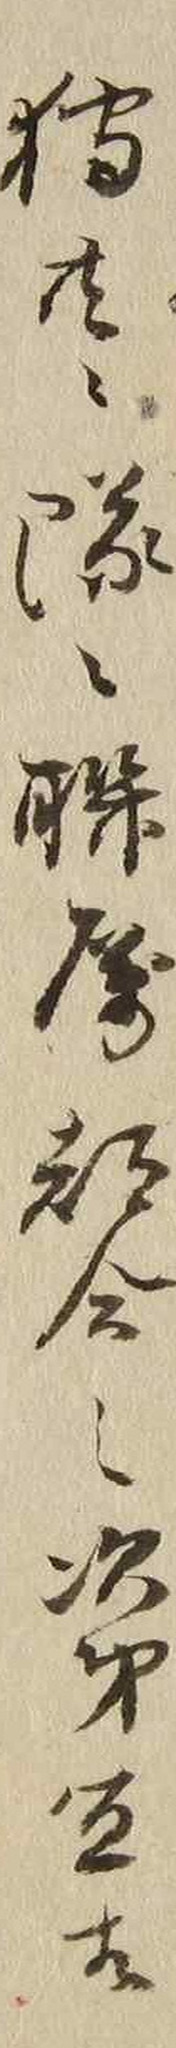狩共ニ隊々聯属都合之次第宜相
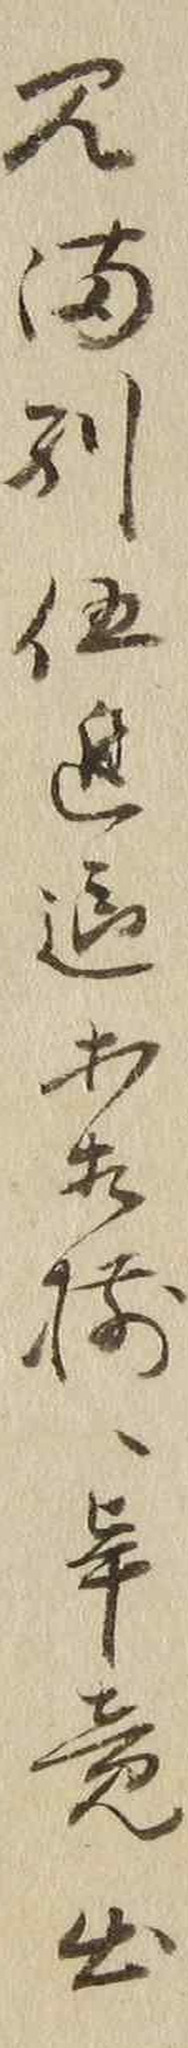見備列伍進退等相揃候畢竟出
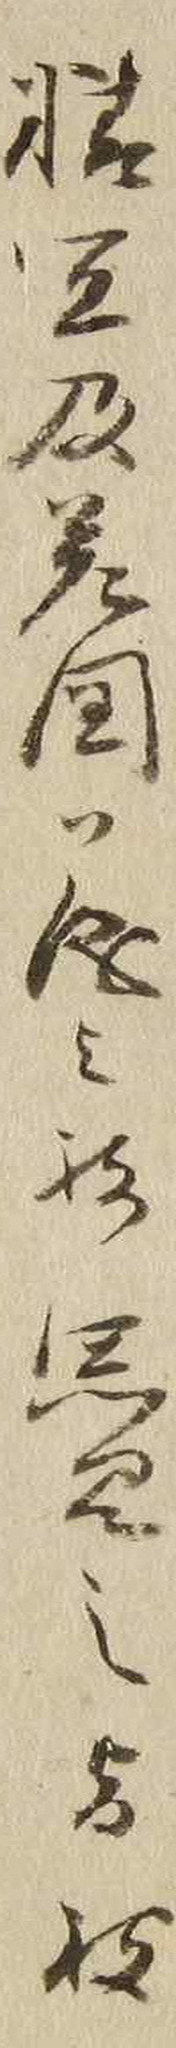精宜及差図候儀と被思召之旨彼
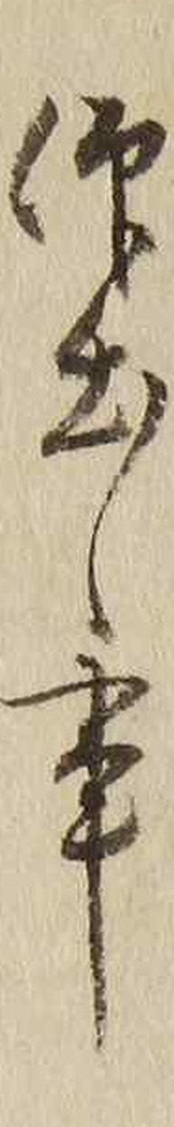仰出候事
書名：諸士系譜　巻之225　ま之部6
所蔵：会津若松市立会津図書館
